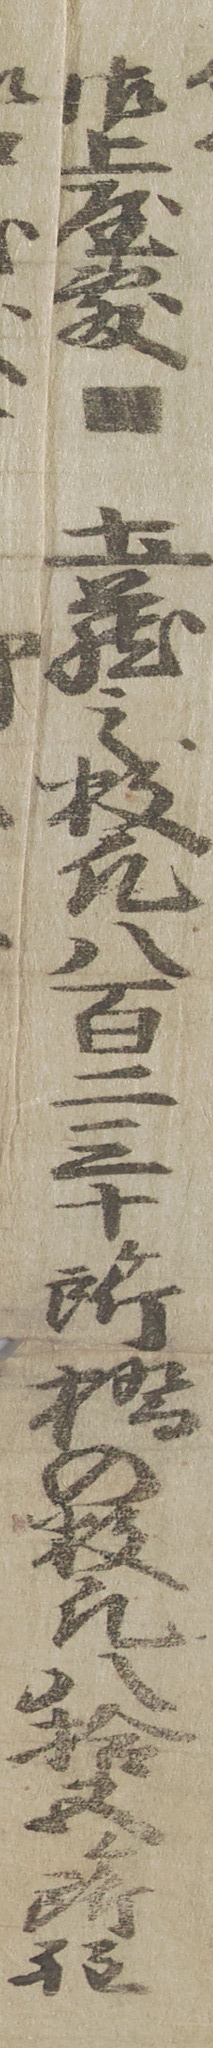御上屋敷土蔵之数凢八百二三十ヶ所橋の数凢八拾五ヶ所程
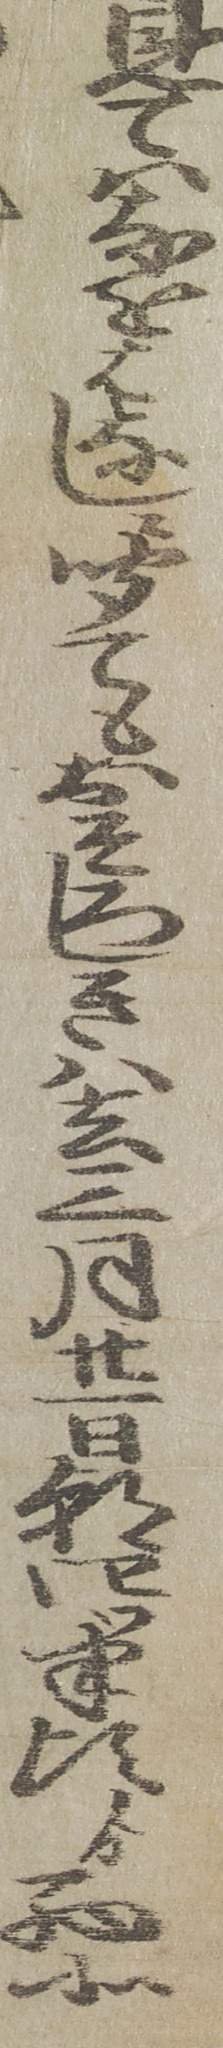見てハなをはなし聞てもおそろしきハ去三月廿一日朝四ツ半頃ゟ西北
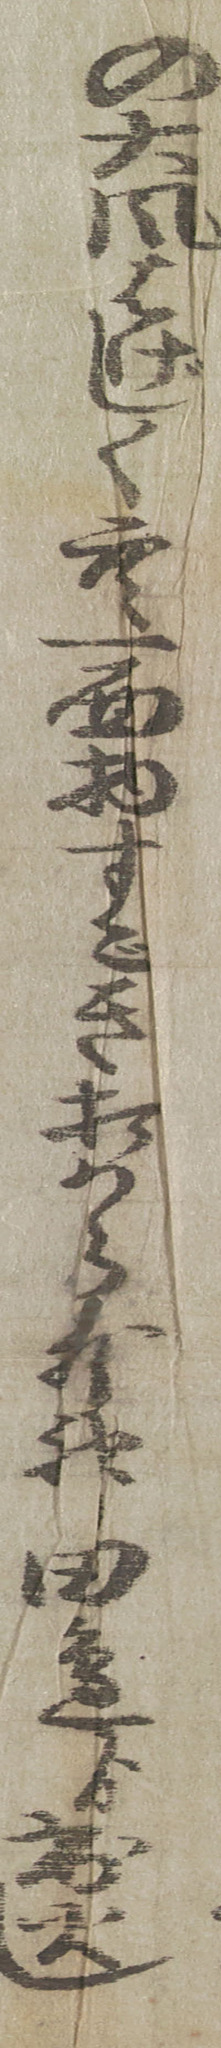の大風はげしく空一面物すごき折から外神田邊ゟ出火し
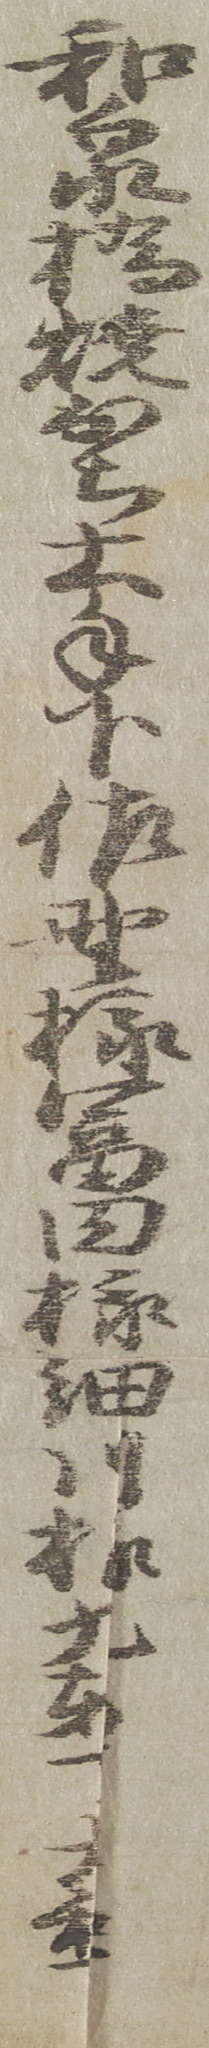和泉橋焼おち土手下佐野様富田様細川様九軒丁
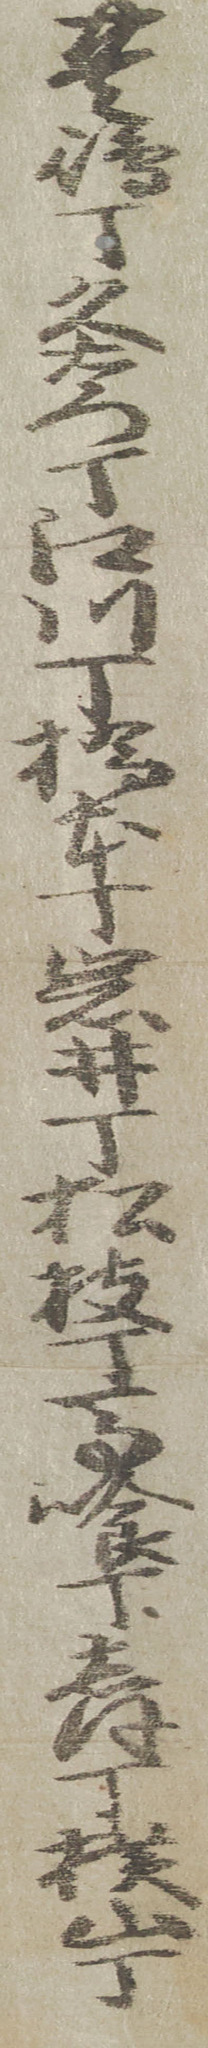豊嶋丁久右衛門丁江川丁橋本丁岩井丁松枝丁馬喰丁しほ丁横山丁
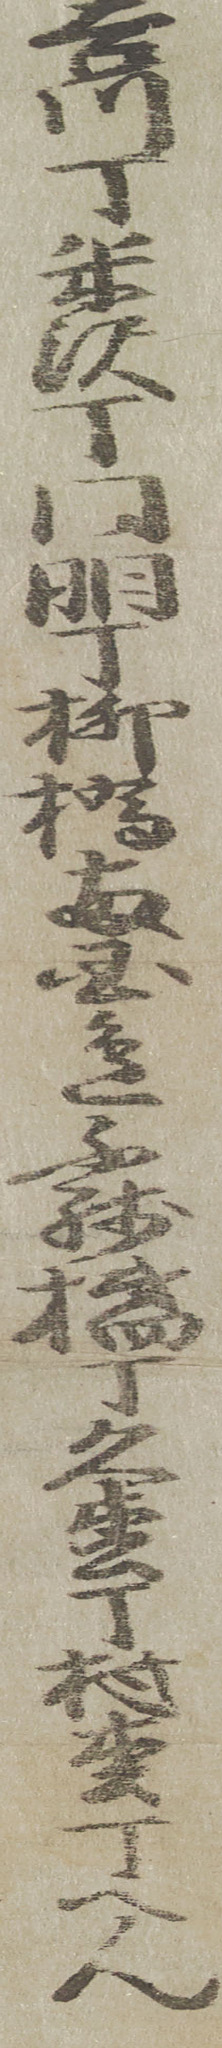吉川丁米沢丁同朋丁柳橋両国邊不残橘丁久松丁村松丁へん
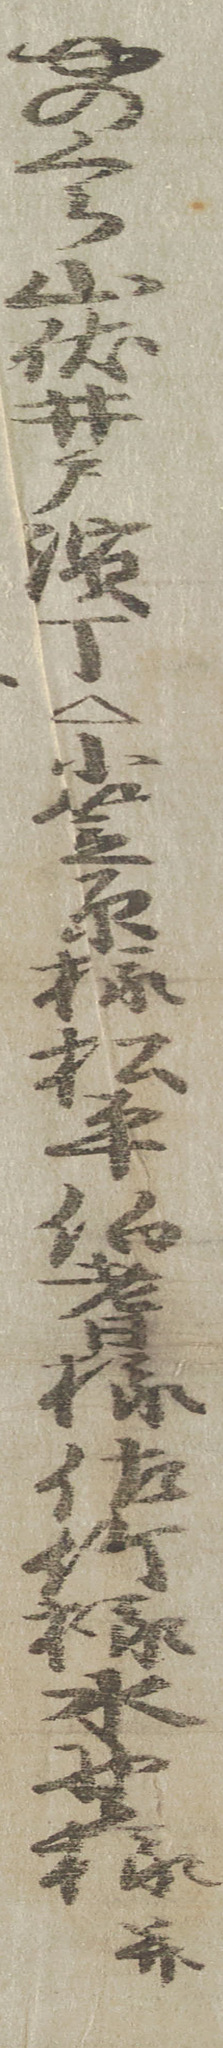やのくら山伏井戸濱丁△小笠原様松平伯耆様佐竹様水野様并
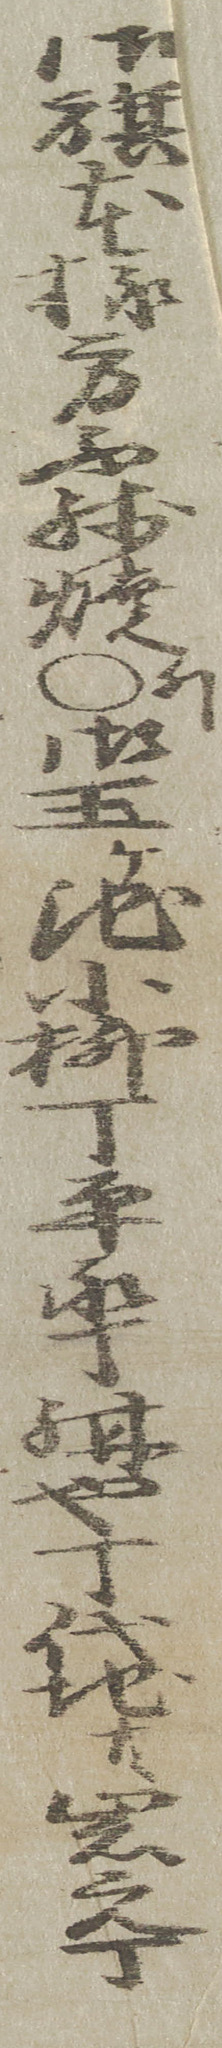御旗本様方不残焼◯御玉ヶ池小柳丁平永丁紺や丁代地共岩元丁
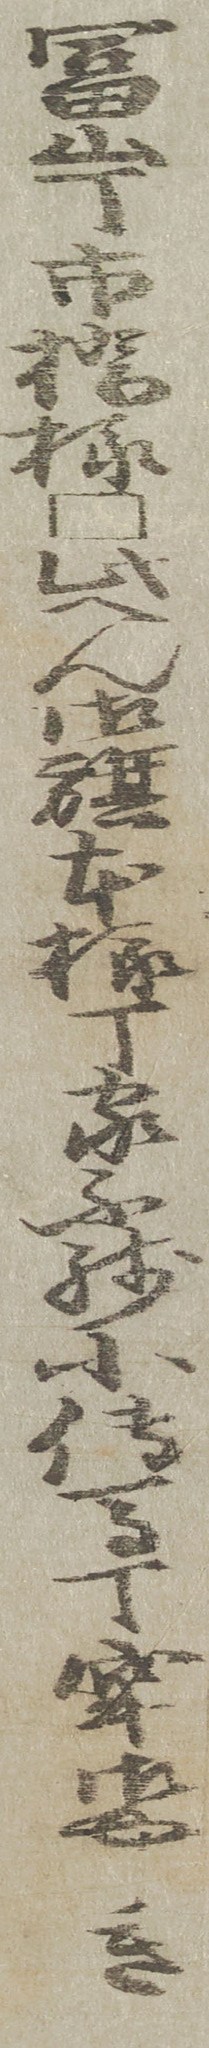富山丁市橋様此へん御旗本様丁家不残小傳馬丁牢御やしき
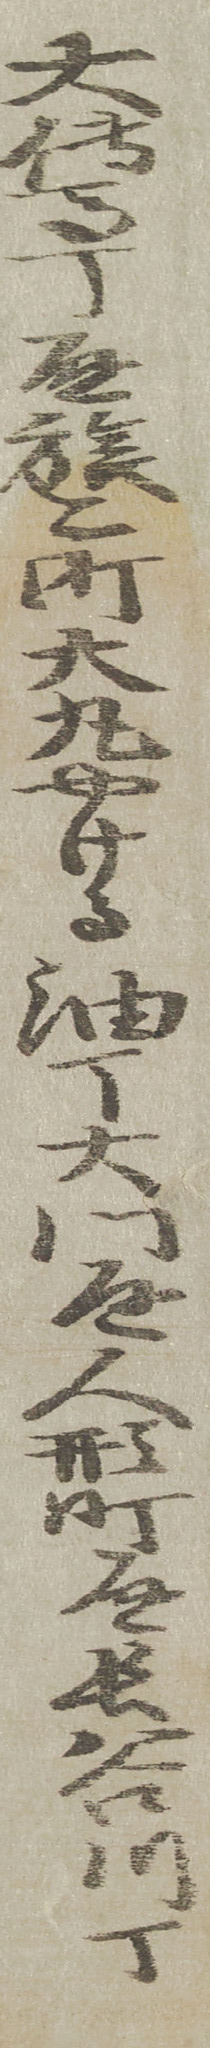大傳馬丁通旅こ町大丸やける油丁大門通人形町通長谷川丁
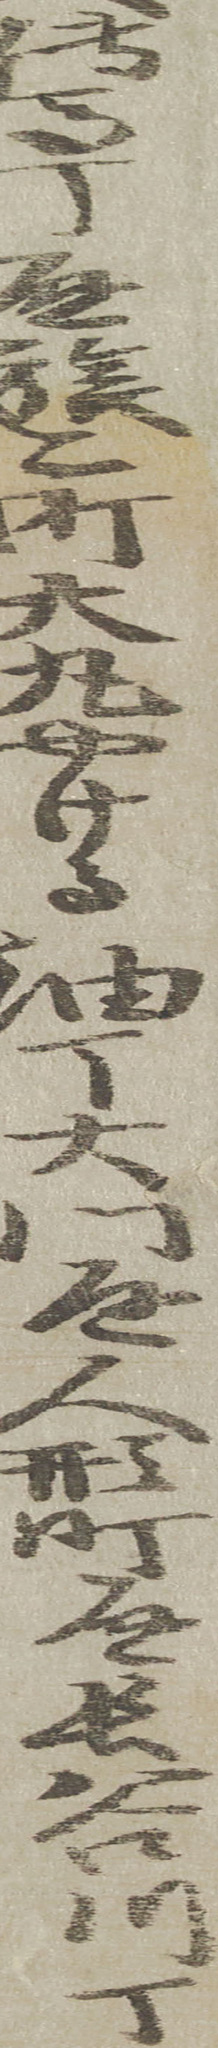大傳馬丁通旅こ町大丸やける油丁大門通人形町通長谷川丁
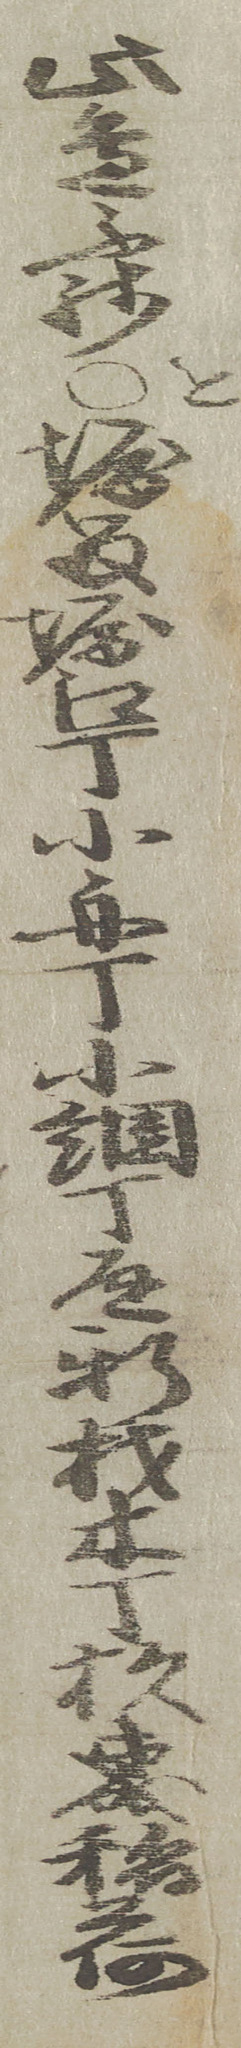此邊不残◯堀留堀江丁小舟丁小網丁通新材木丁杉森稲荷
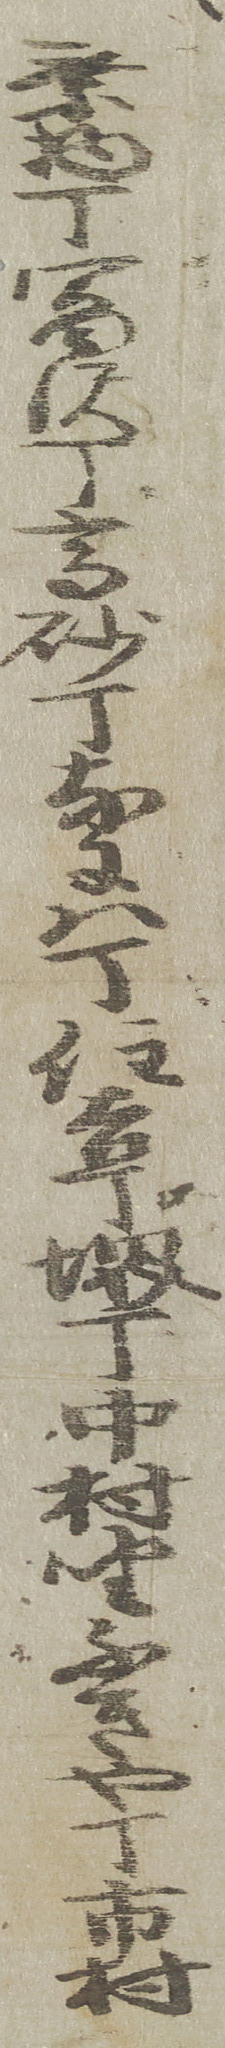乗物丁富沢丁高砂丁なにハ丁住吉丁堺丁中村坐ふきや丁市村
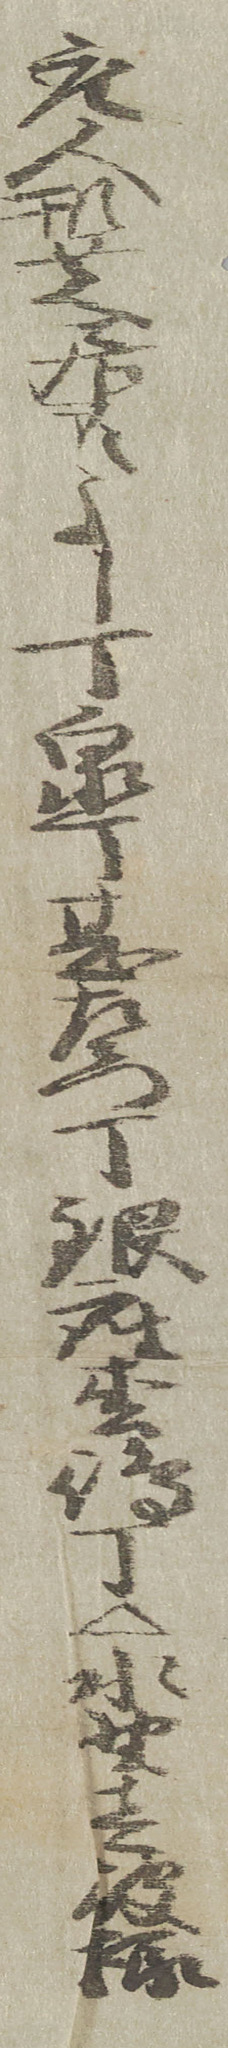座人形芝居ともよし丁泉丁甚左衛門丁銀座松嶋丁△水野壱岐様
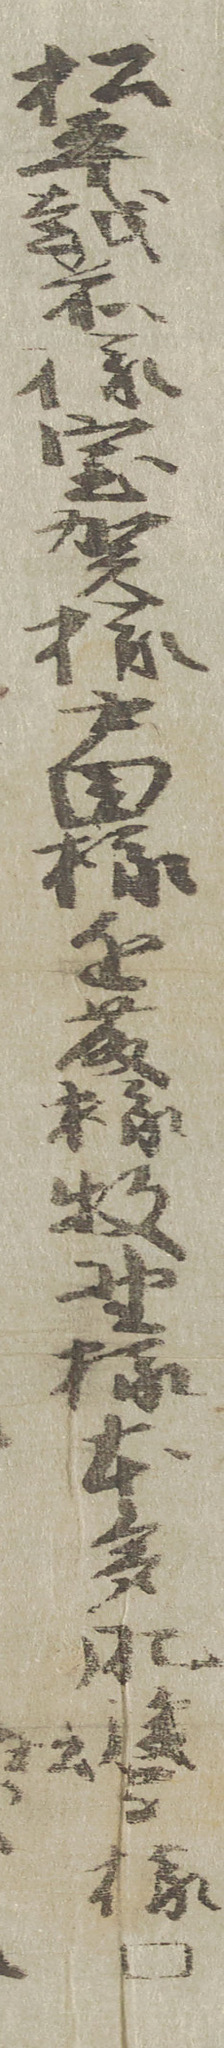松平越前様室賀様戸田様近藤様牧野様本多肥後守様
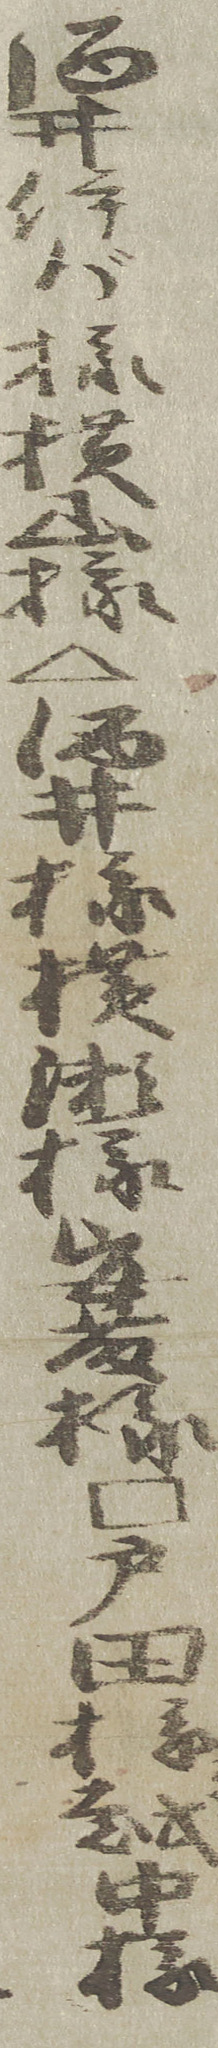酒井伊様横山様△酒井様横瀬様安藤様戸田様越中様
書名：方角場所附 [江戸大火]
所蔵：東京大学総合図書館 General Library in the University of Tokyo, JAPAN
